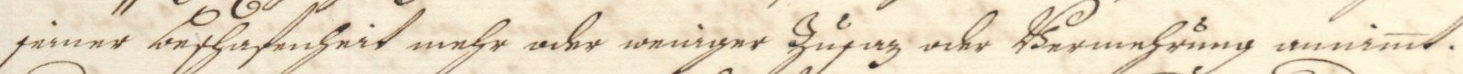seiner Beschafenheit mehr oder weniger Zusaz oder Vermehrung annimmt.
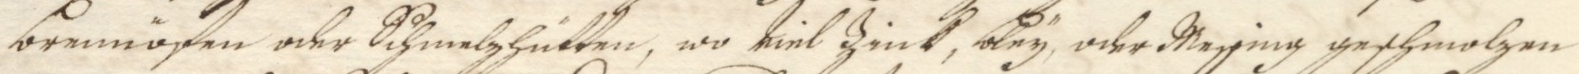Brennöfen oder Schmelzhütten, wo viel Zink, Bley, oder Messing geschmolzen
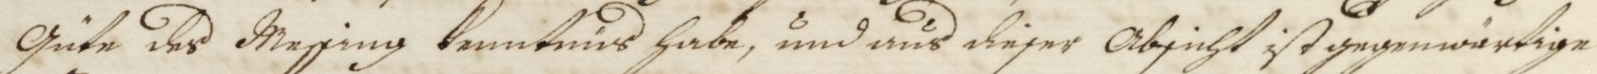Güte des Messing kenntnüs habe, und aus dieser Absicht ist gegenwärtige
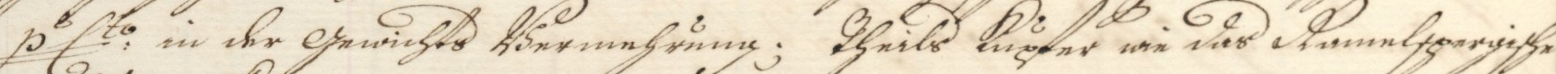pro Cento in der Gewichts Vermehrung. Theils Kupfer wie das Ramelspergische
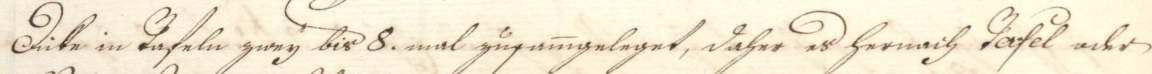Dicke in Tafeln zwey bis 8. mal zusammgeleget, daher es hernach Tafel oder
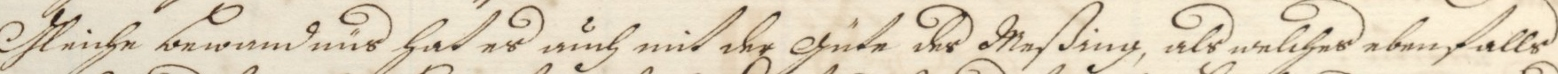Gleiche Bewandnüs hat es auch mit der Güte des Meßing, als welches ebenfalls
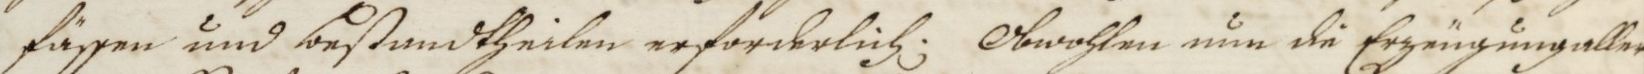fässen und Bestandtheilen erforderlich. Obwohlen nun die Erzeügung aller
